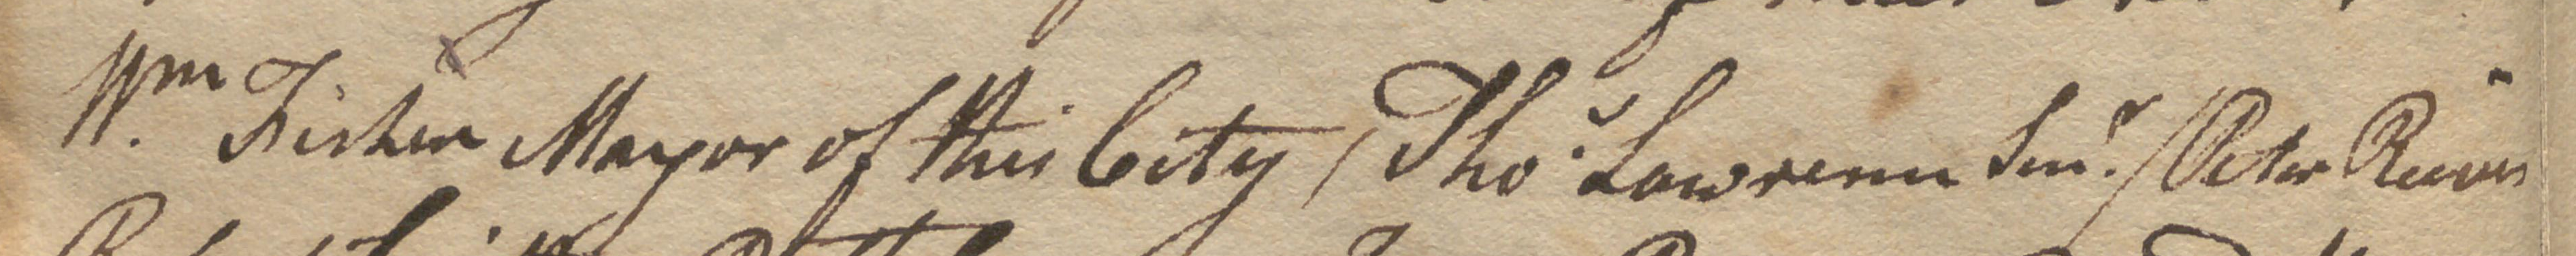W^m. Fisher Mayor of this City, Tho^s Lawrence Sen^r, Peter Reeves
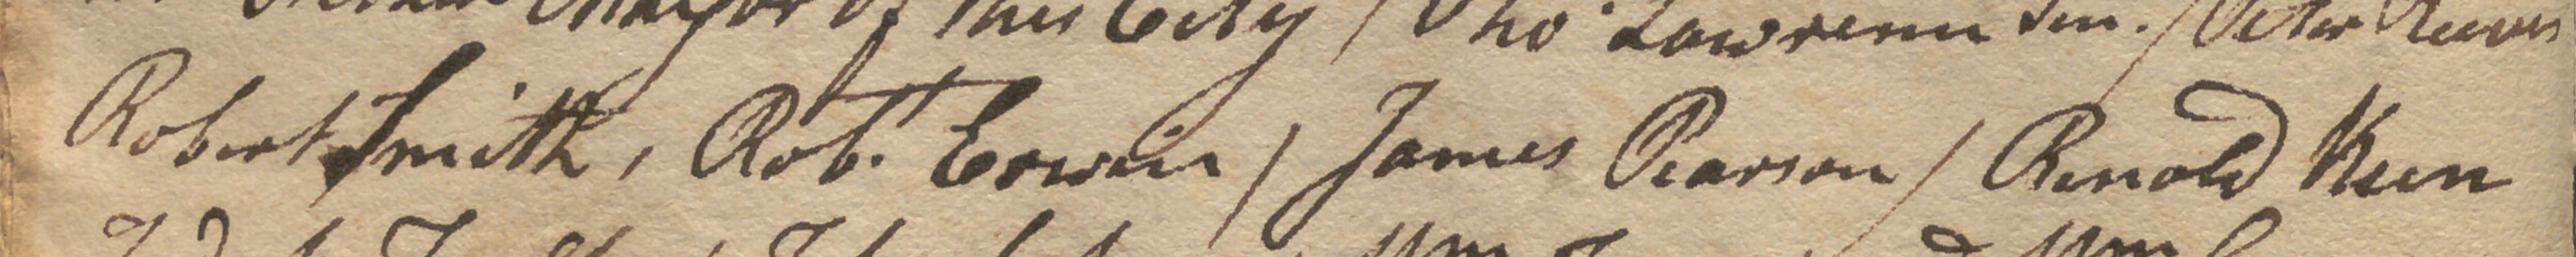Robert Smith, Rob^t. Erwin, James Pearson, Renold Kun
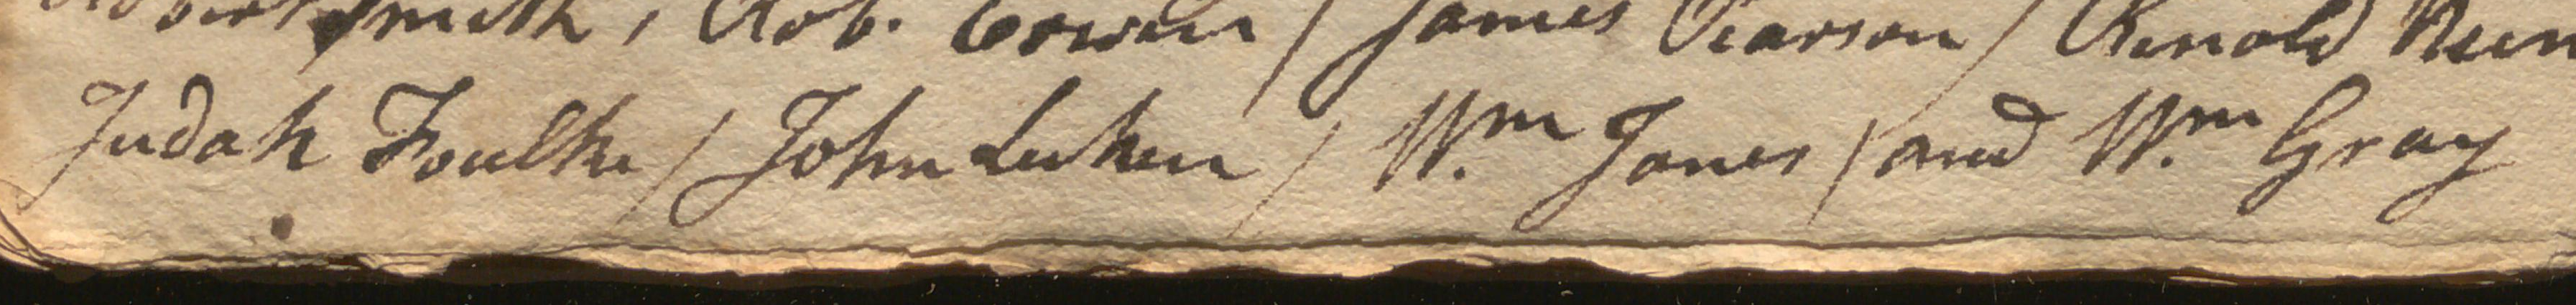Judah Foulke, John Luken, W^m. Jones, and W^m. Gray
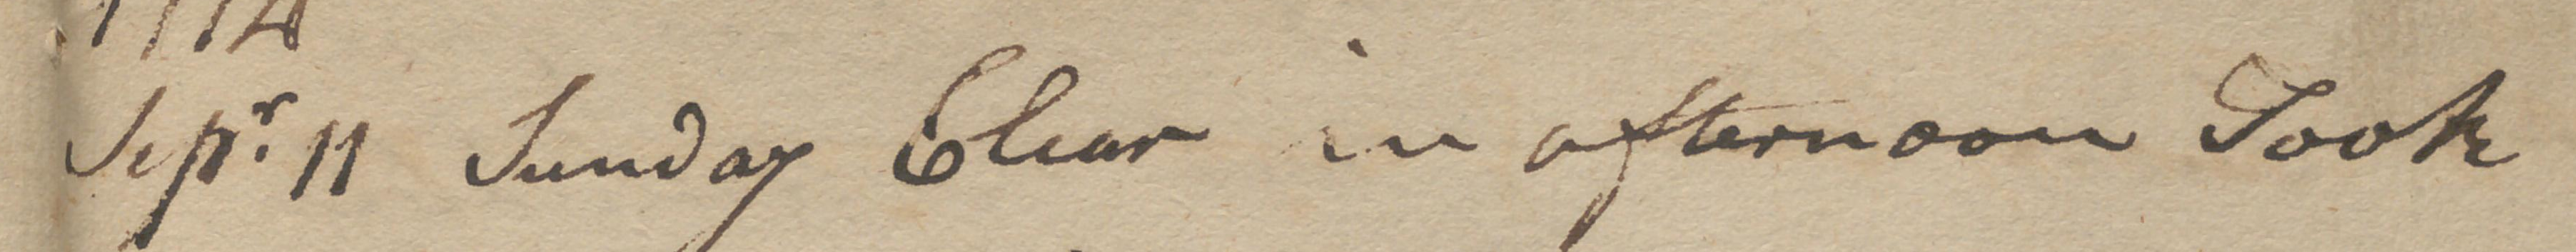Sep^r. 11 Sunday Clear in afternoon Took
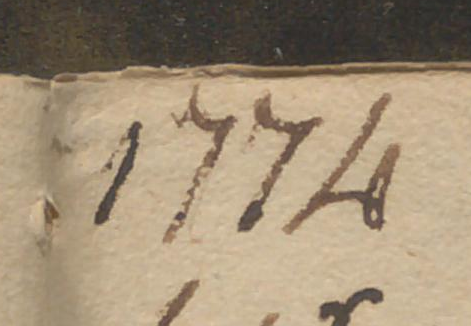1774
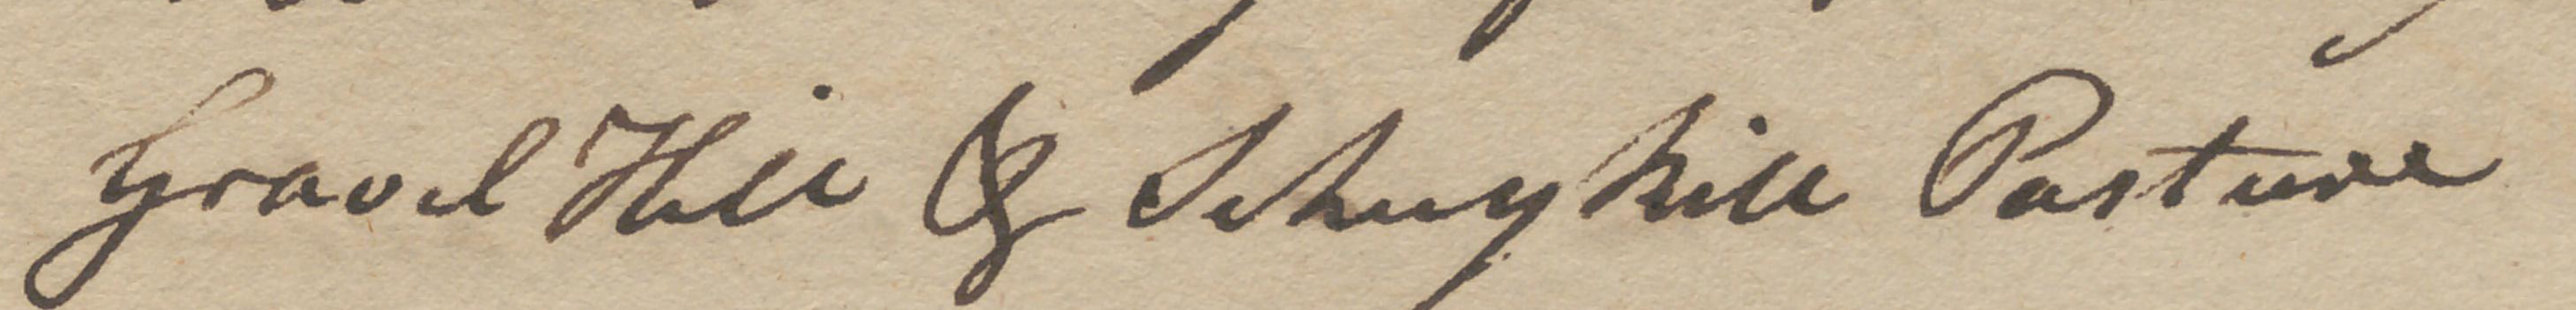Gravel Hill & Schuykill Pasture
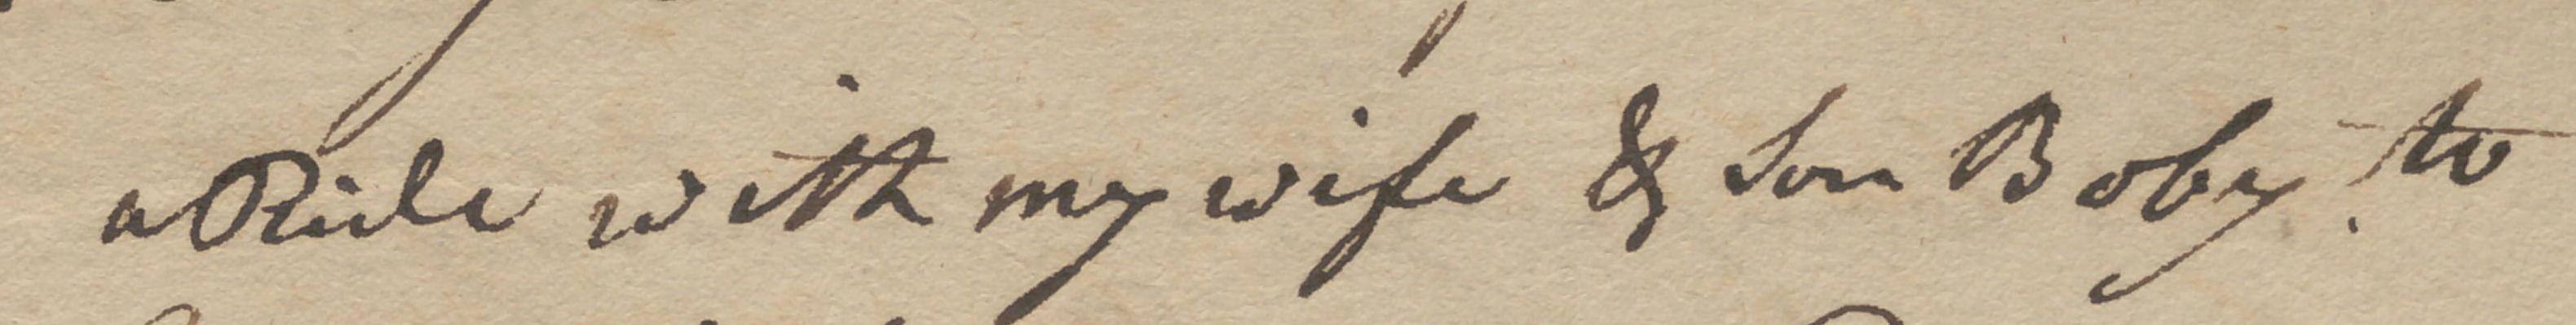a Ride with my wife & son Boby to
